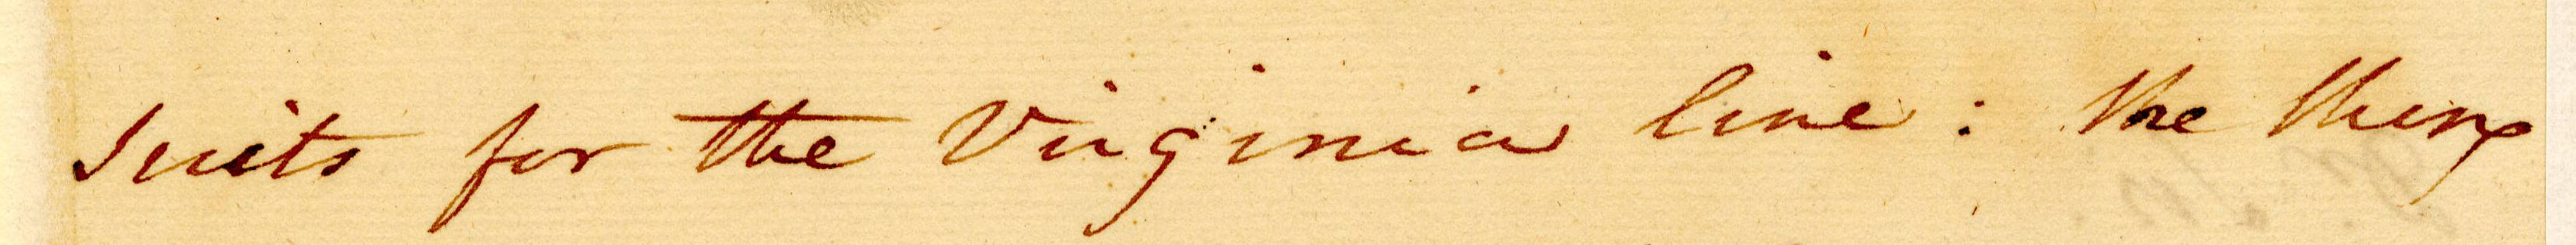suits for the Virginia line: the thing
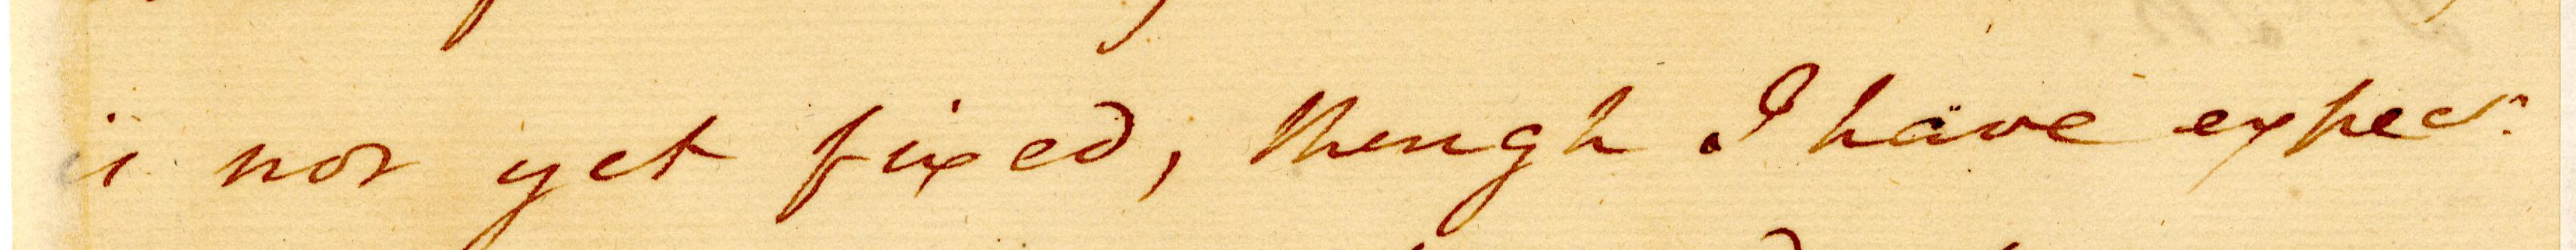is not yet fixed, though I have expec-
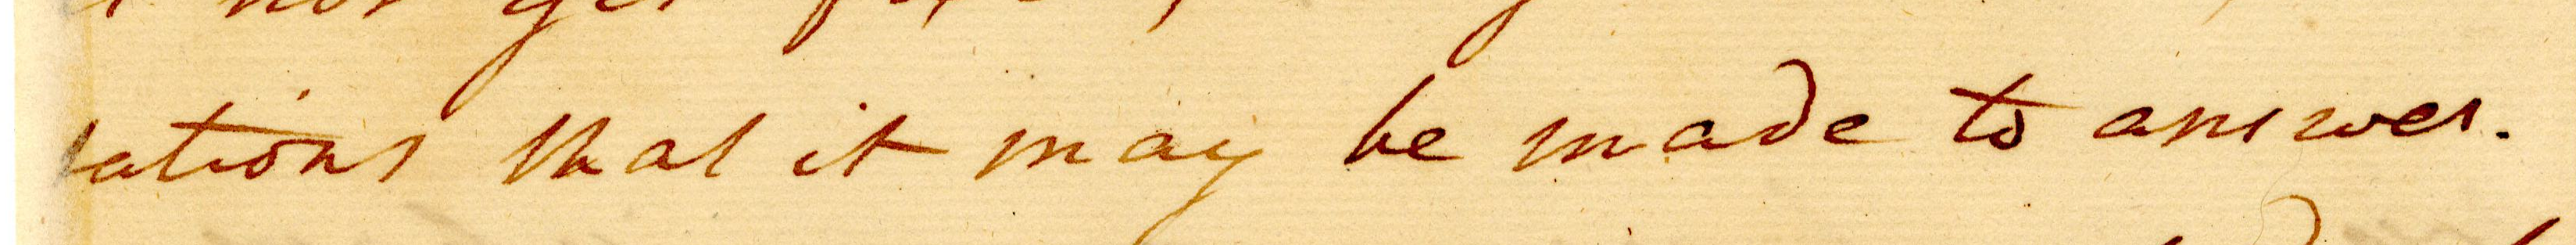tations that it may be made to answer.
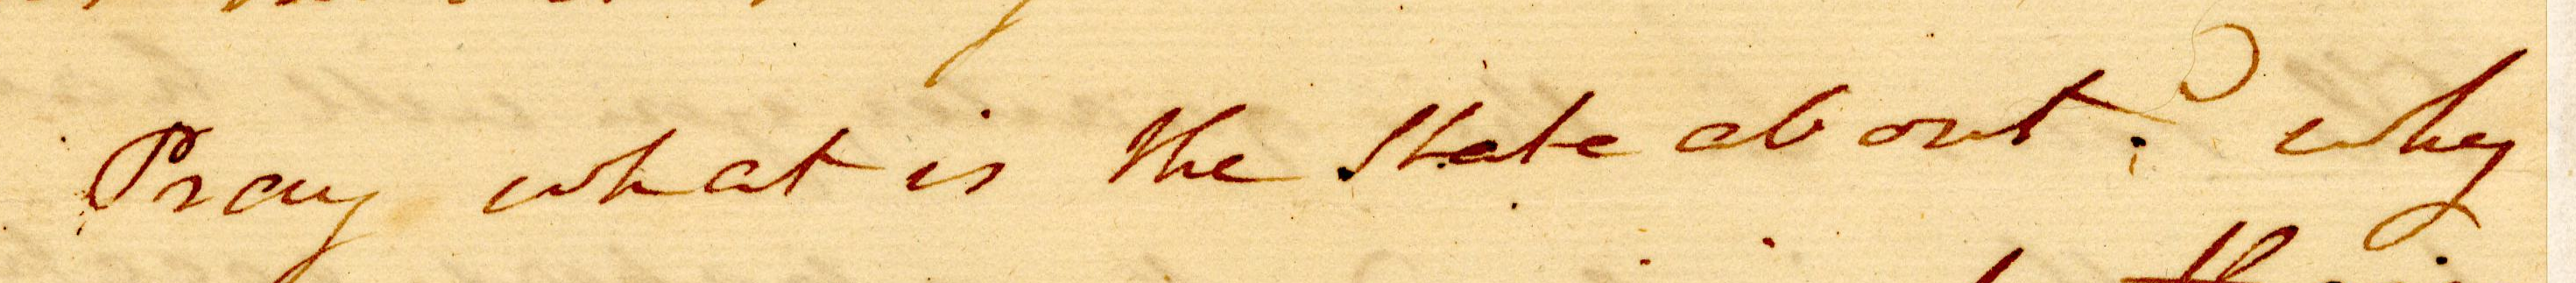Pray what is the state about? why
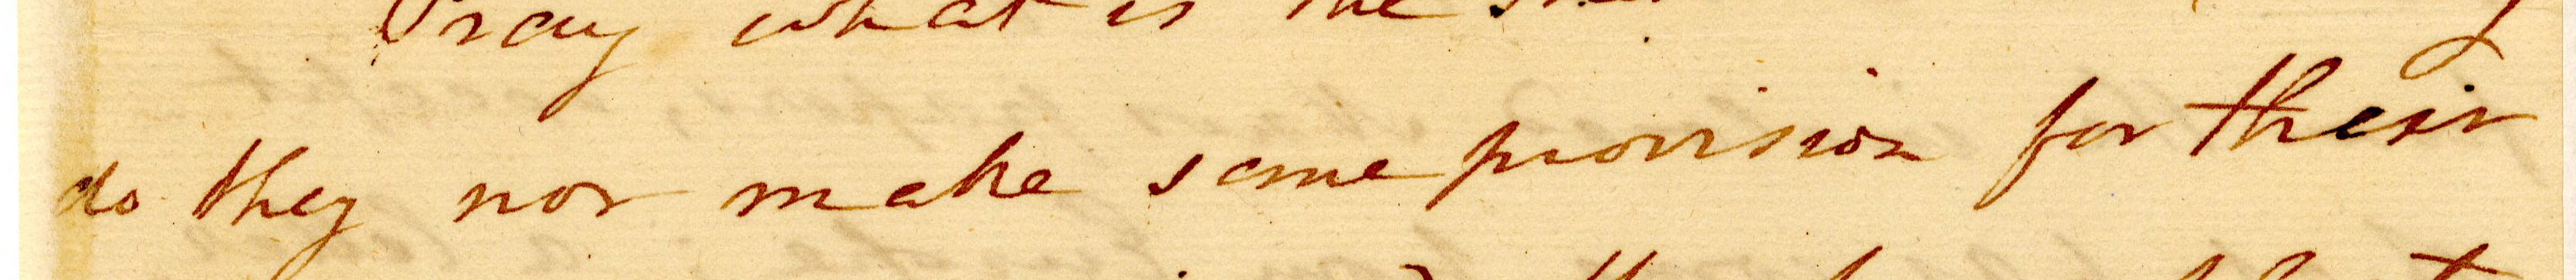do they not make some promises for their
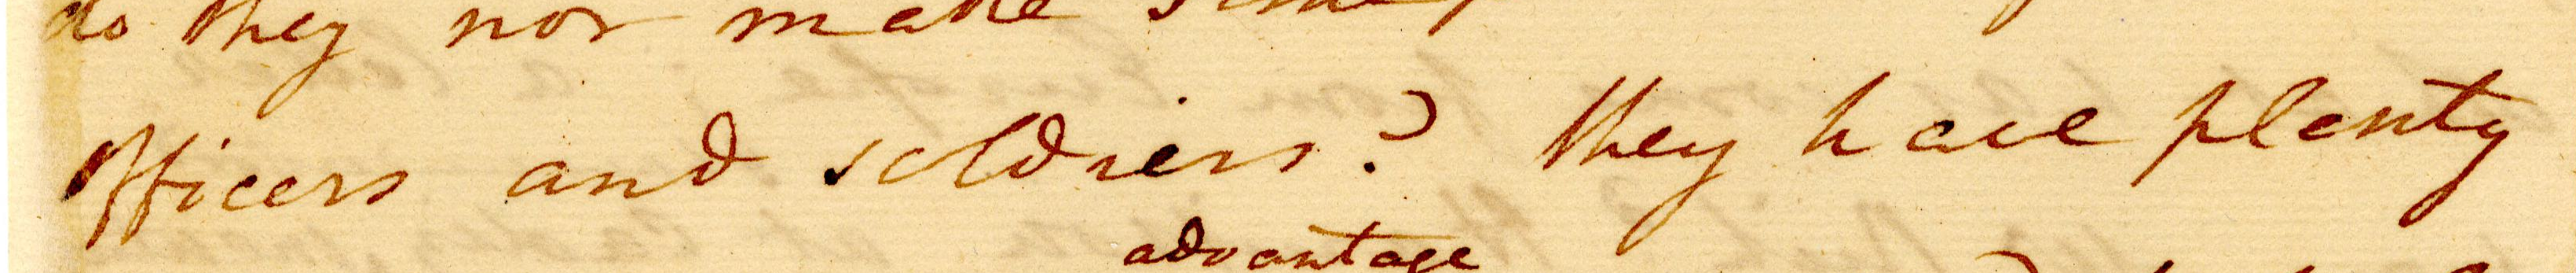officers and soldiers? they have plenty
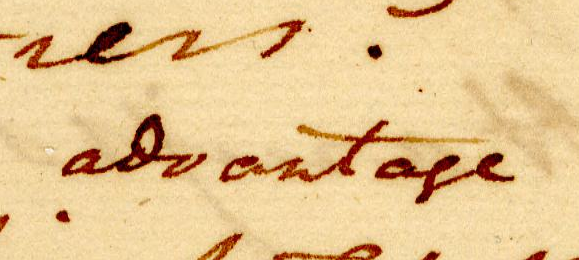advantage
